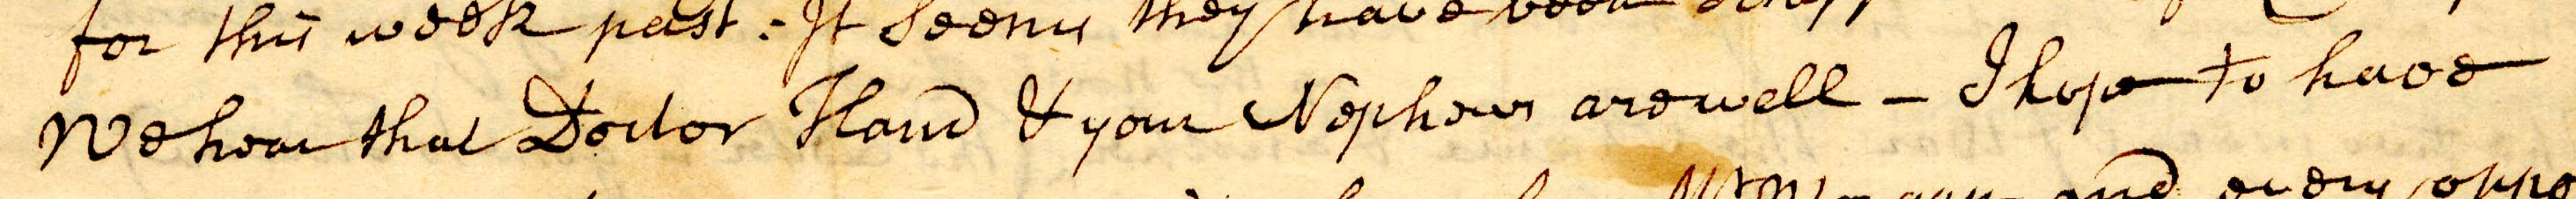We hear that Doctor Hand & your Nephews are well- I hope to have
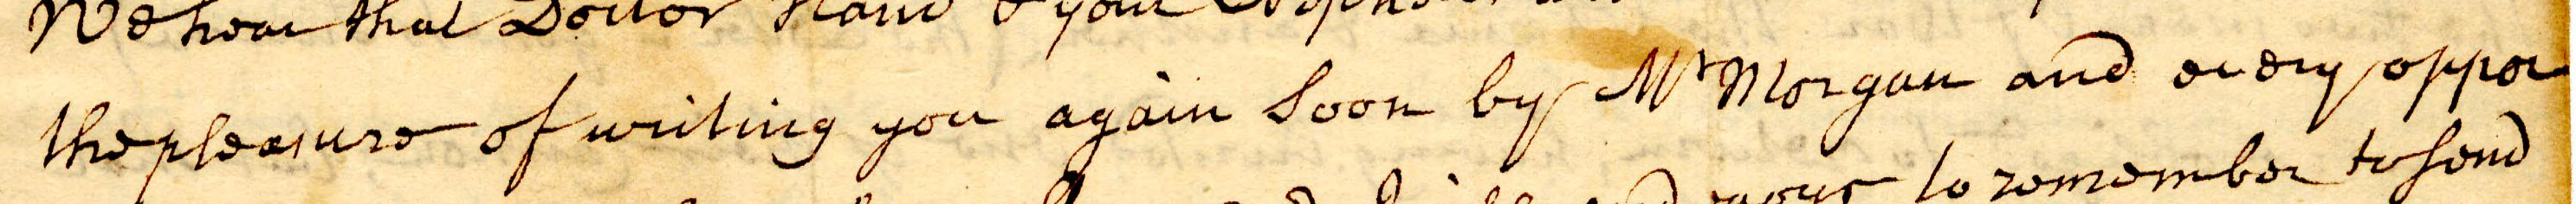the pleasure of writing you again Soon by M^r Morgan and every oppor
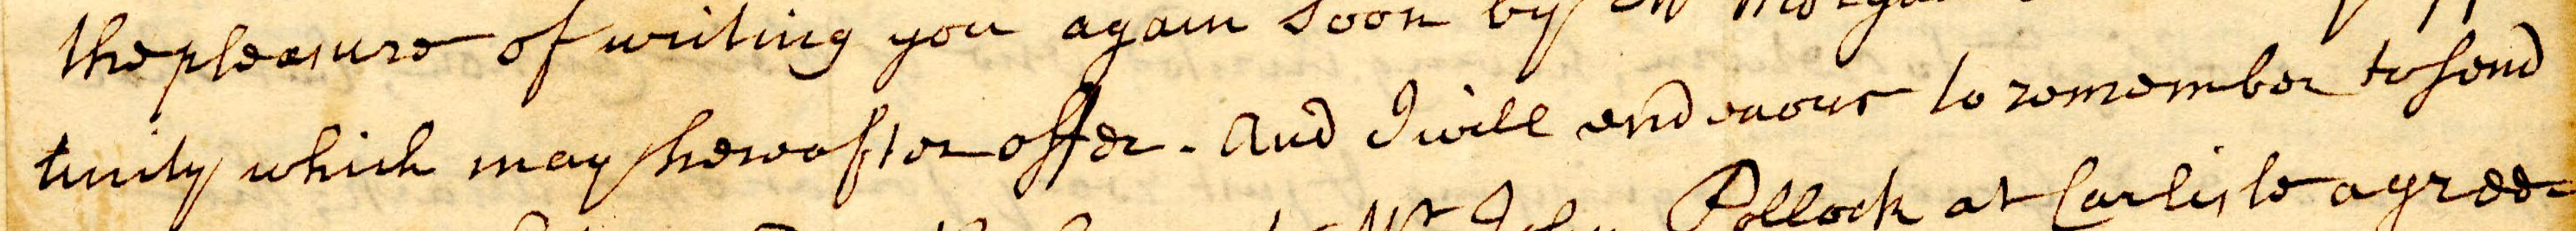tunity which may hereafter offer. And I will endeavour to remember to send
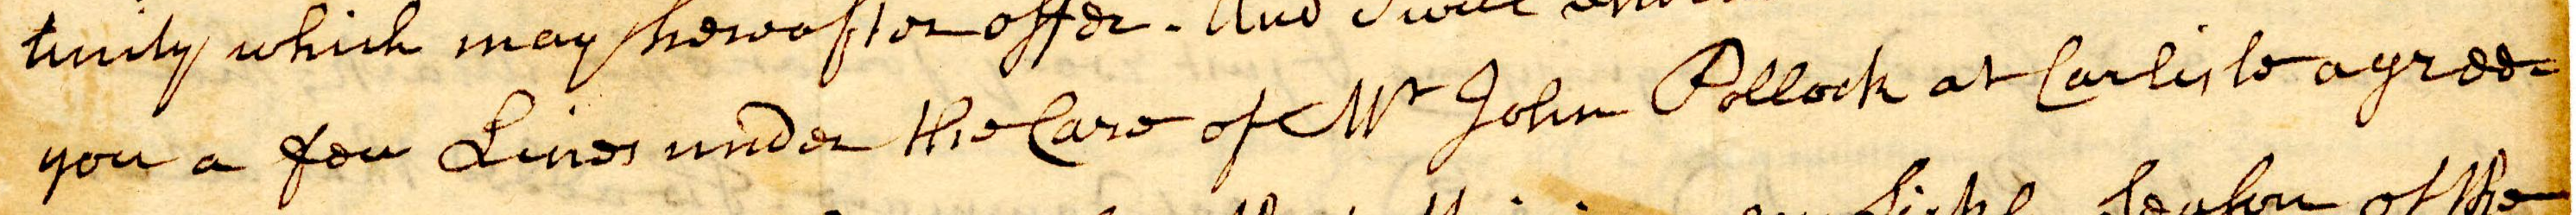you a few Lines under the Care of M^r John Pollock at Carlisle agree
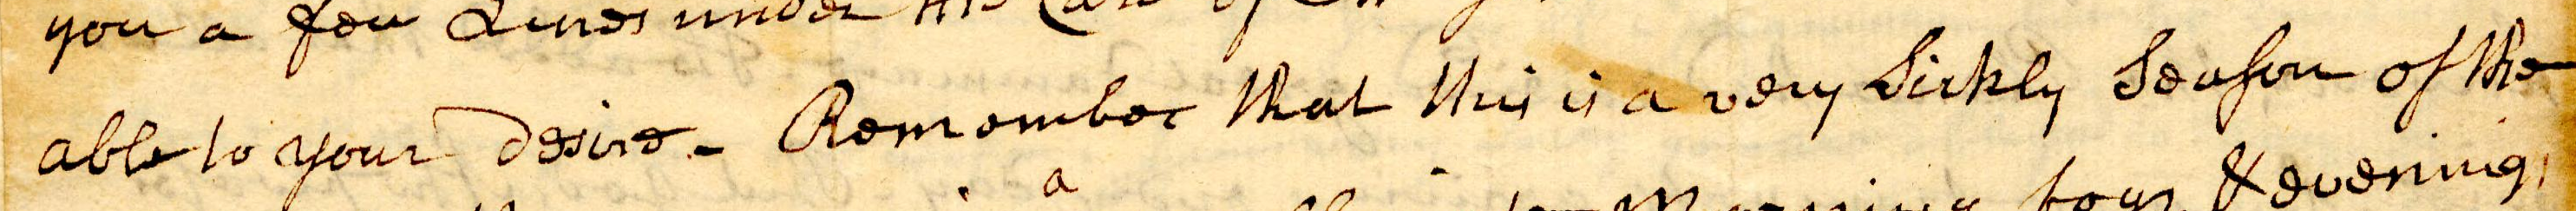able to your desire- Remember that this is a very Sickly Season of the
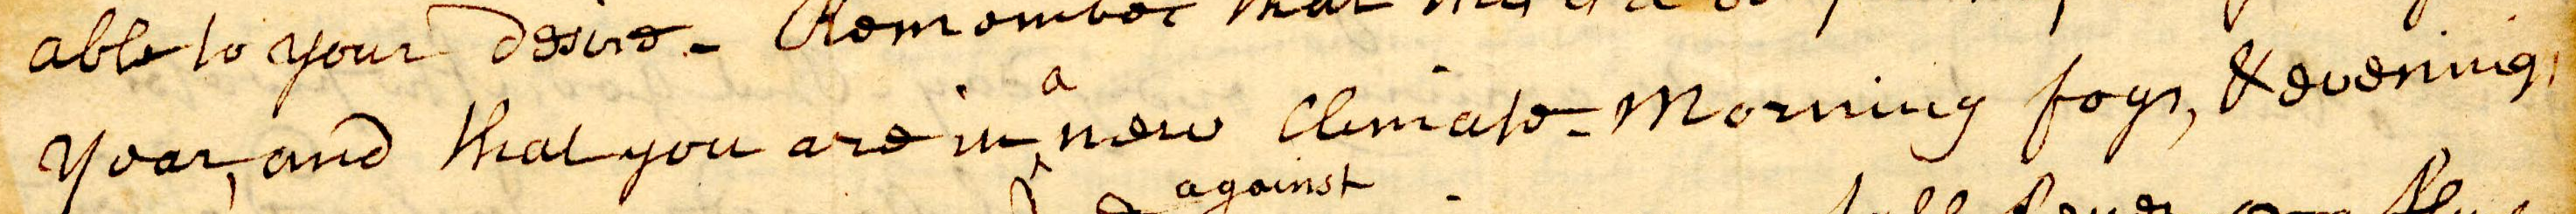year, and that you are in ^a new Climate-Morning fogs, & evening
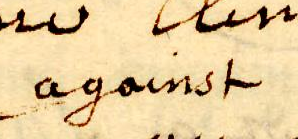against
